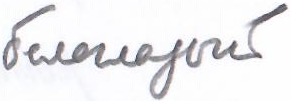белоглазый
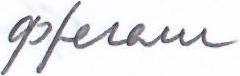фрегат
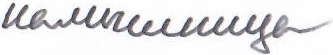камышница
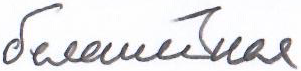белошейная
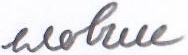еловик
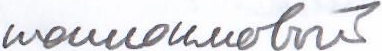тонкоклювый
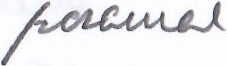рогатая
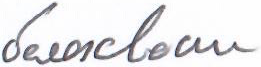белохвост
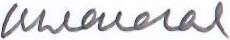иглоногая
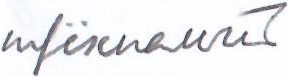трёхпалый
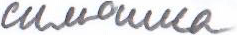сплюшка
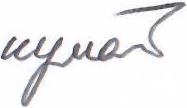кумай
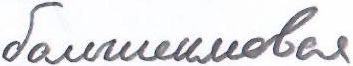большеклювая
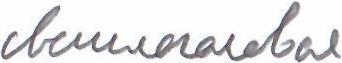светлоголовая
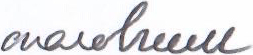ополовник
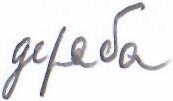деряба
